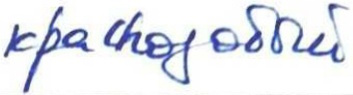краснозобый
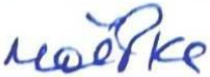моёвка
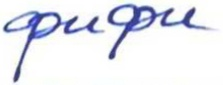фифи
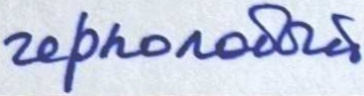черполобый
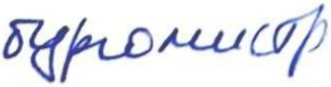бургомистр
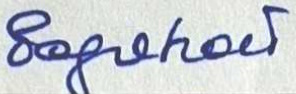водяной
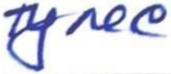тулес
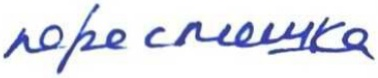поресмешка
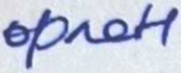орлон
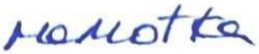момотка
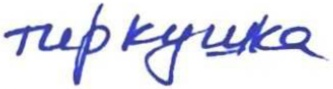тиркушка
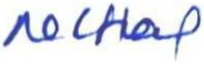лосная
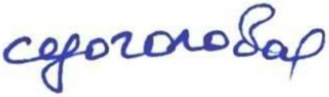седоголовая
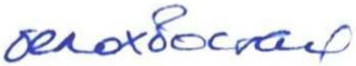белохвостая
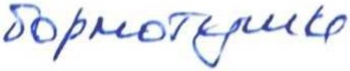бормотушка
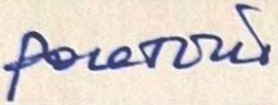рогатый
